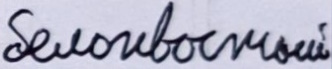белохвостый
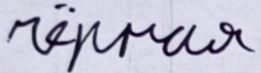чёрная
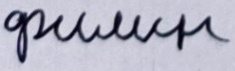филин
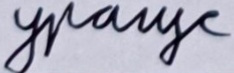урагус
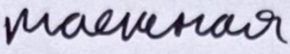таежная
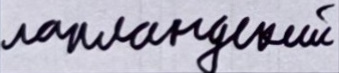лапландский
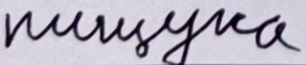пищуха
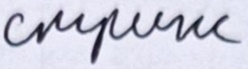стриж
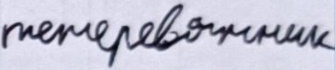тетеревятник
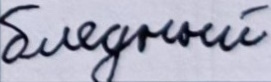бледный
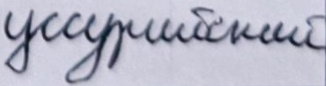уссурийский
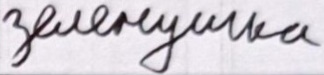зеленушка
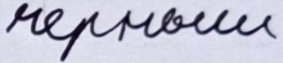черныш
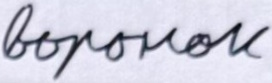воронок
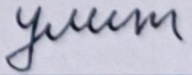улит
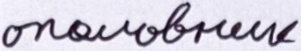ополовник
